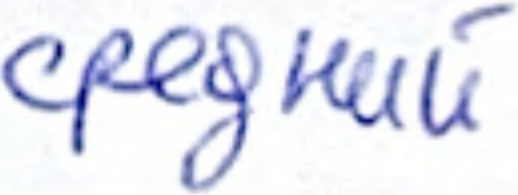средний
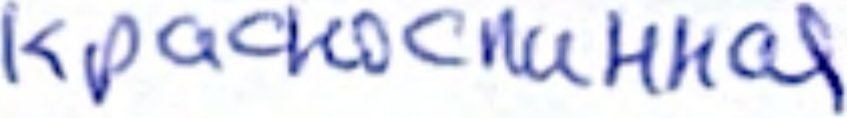красноспинная
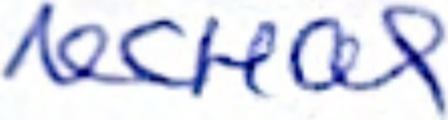лесная
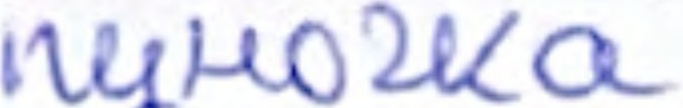пиночка
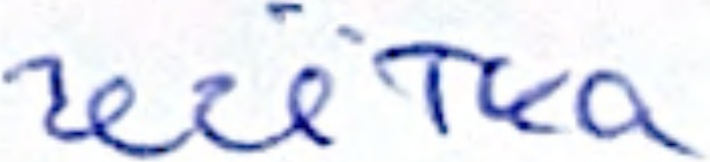чечётка
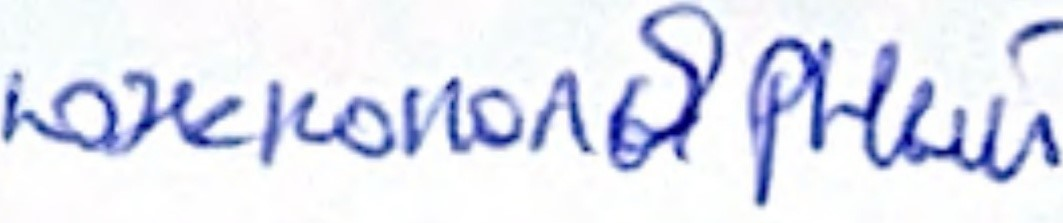южнополярный
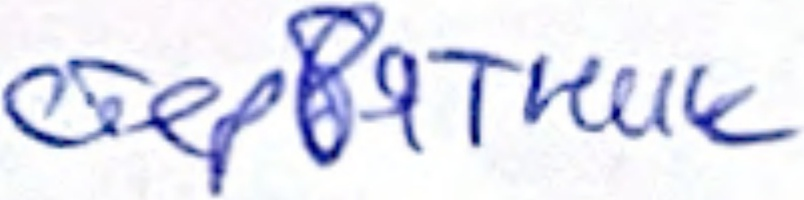стервятник
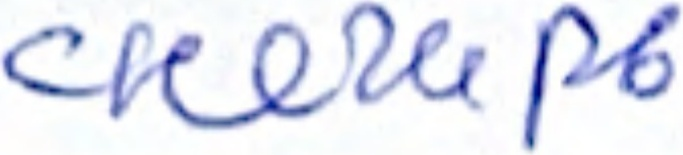снегирь
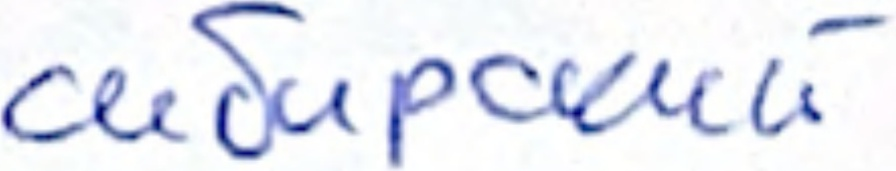сибирский
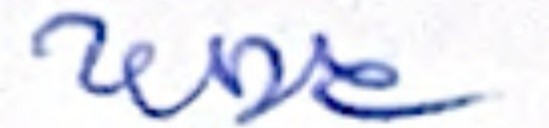чиж
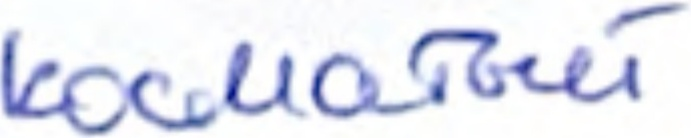косматый
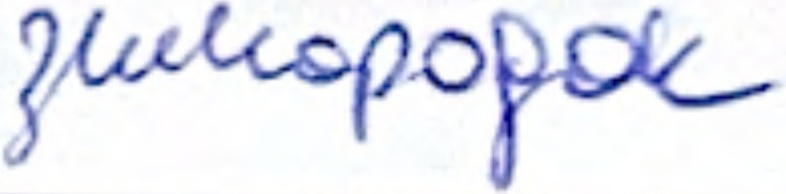зимородок
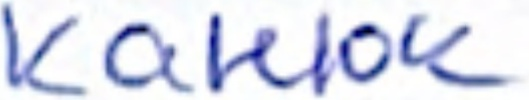канюк
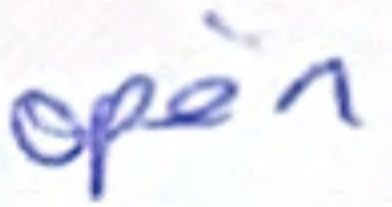орёл
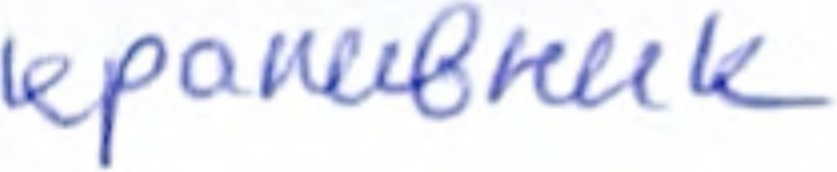крапивник
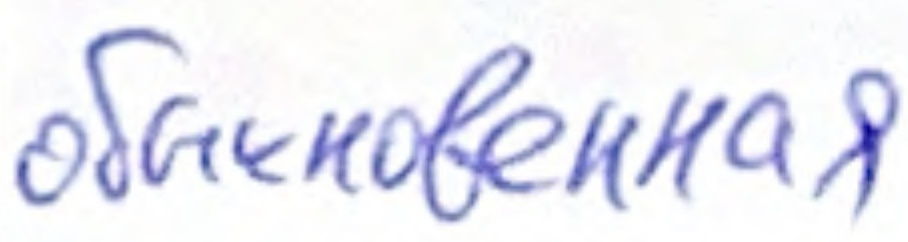обыкновенная
